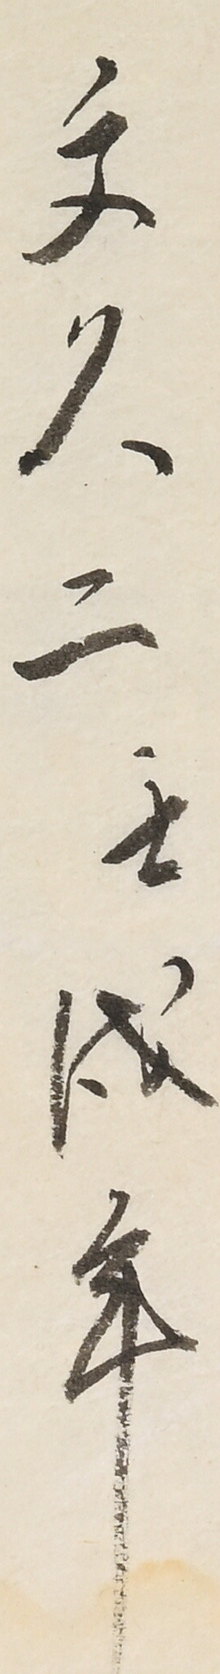文久二壬戌年
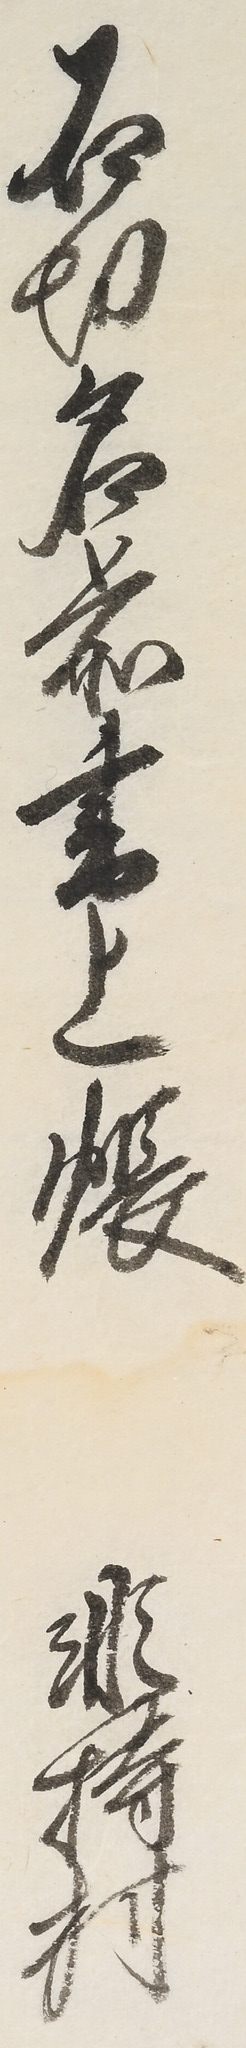石切名前書上帳非持村

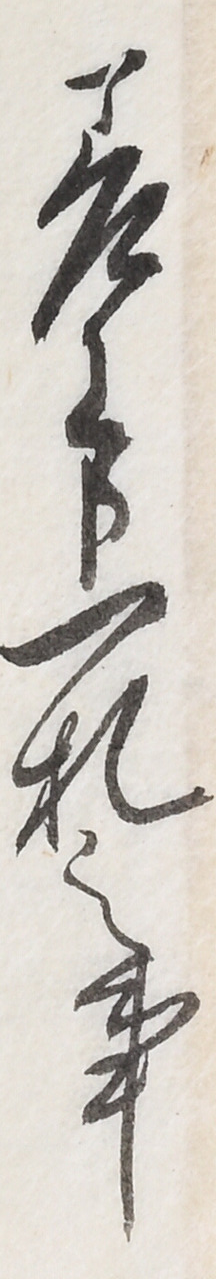差上申一札之事
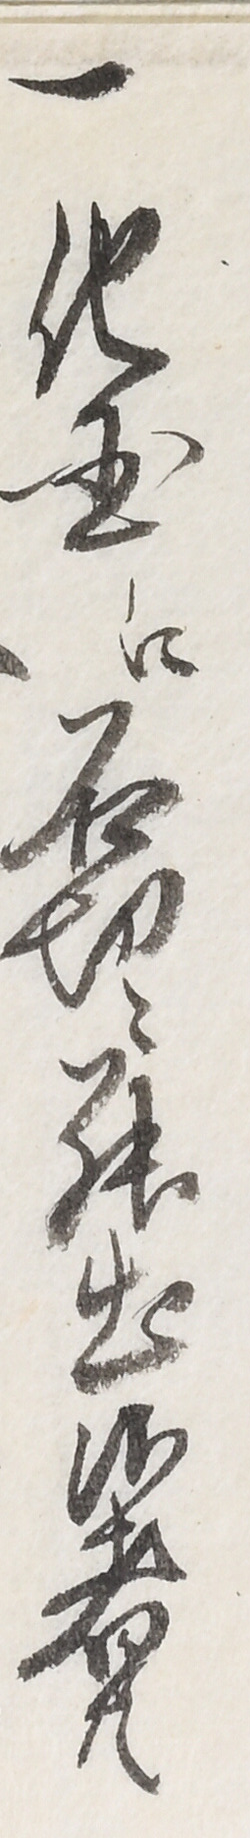一他国え石切ニ罷出候者共
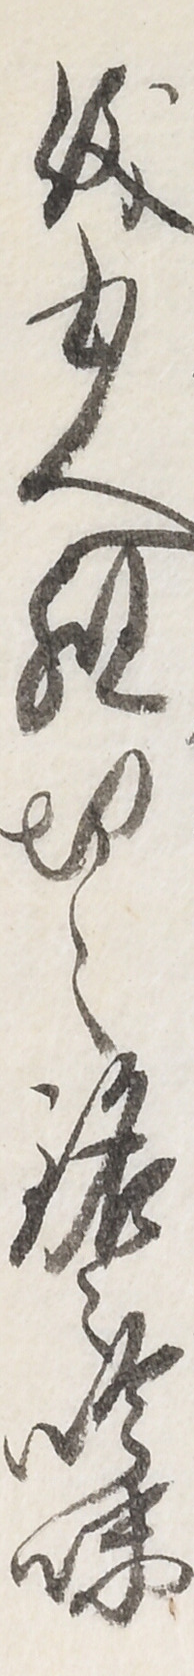儀五人組切々銘々吟味
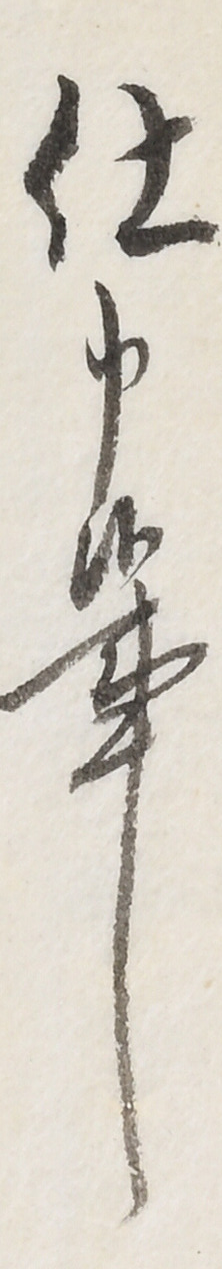仕申候事
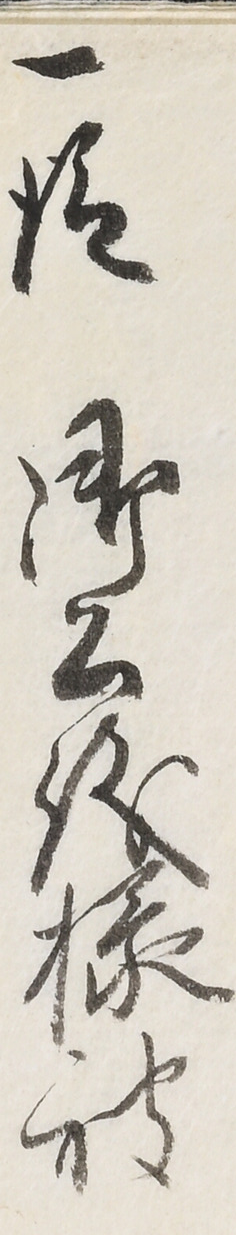一従御公儀様被
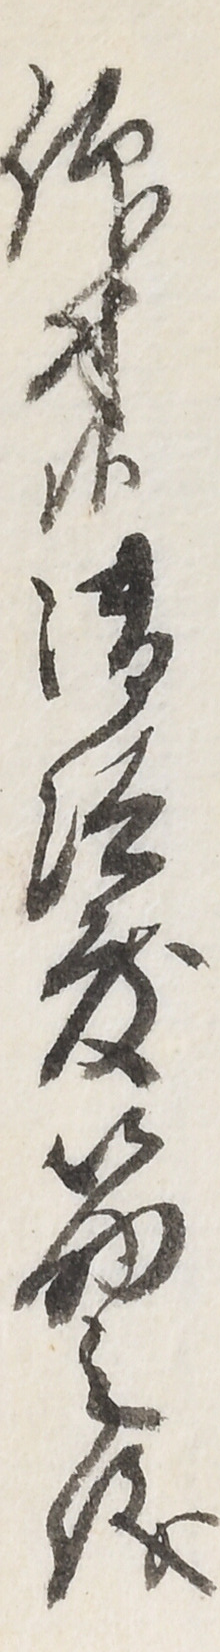仰付候御法度筋之儀
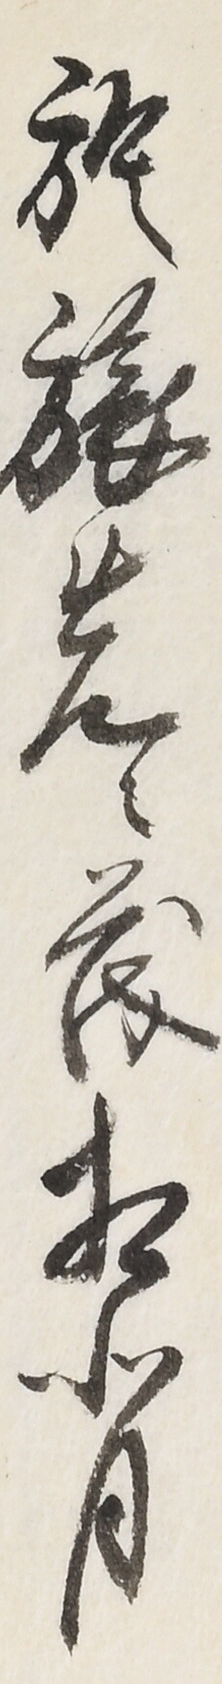於旅先ニも相背
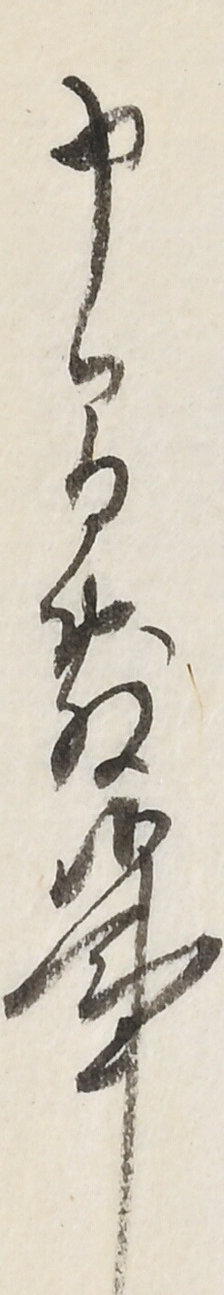申間敷候事
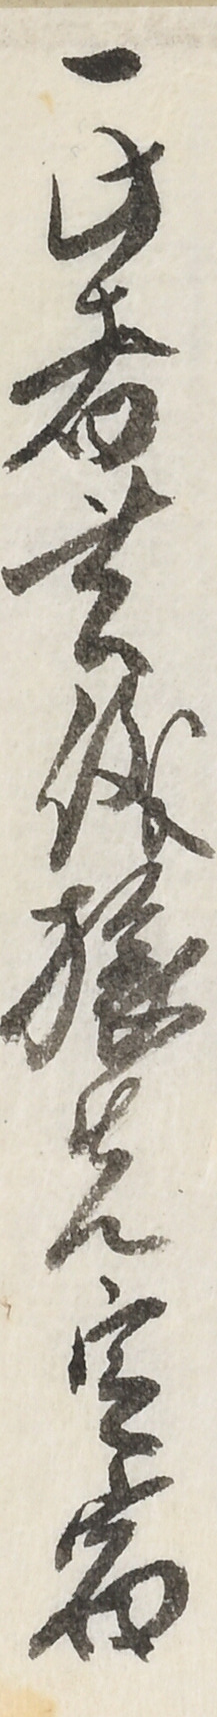一此者共儀旅先定宿
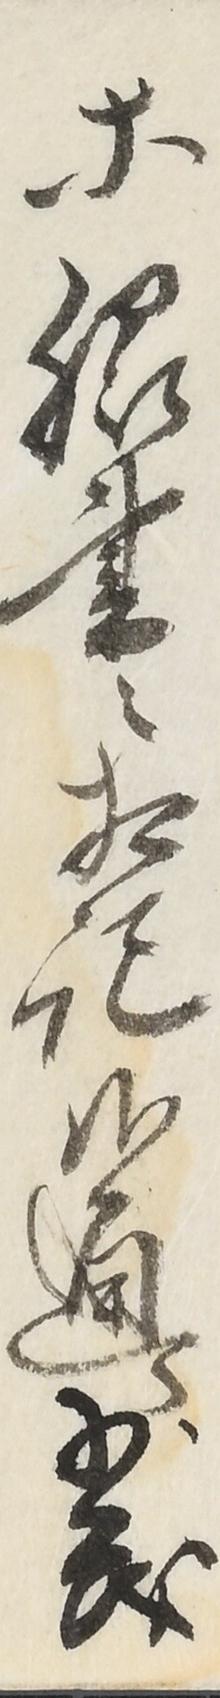等脇書ニ相記候通り少も
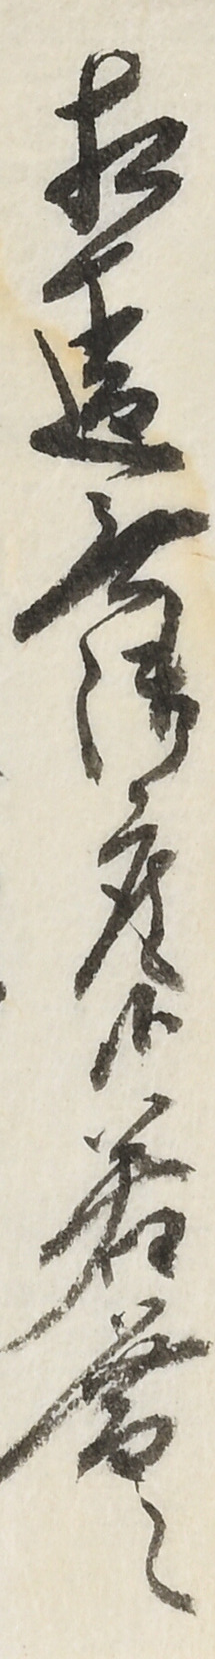相違無御座候若暮ニ
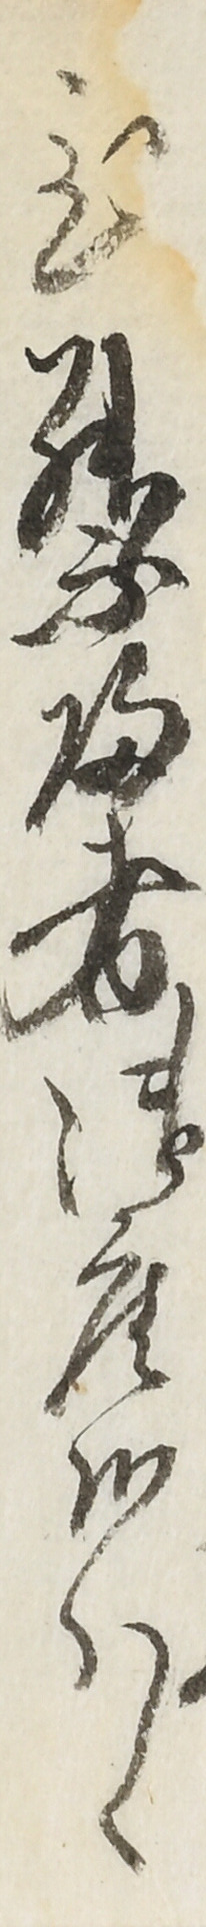至罷不帰者御座候ハヽ
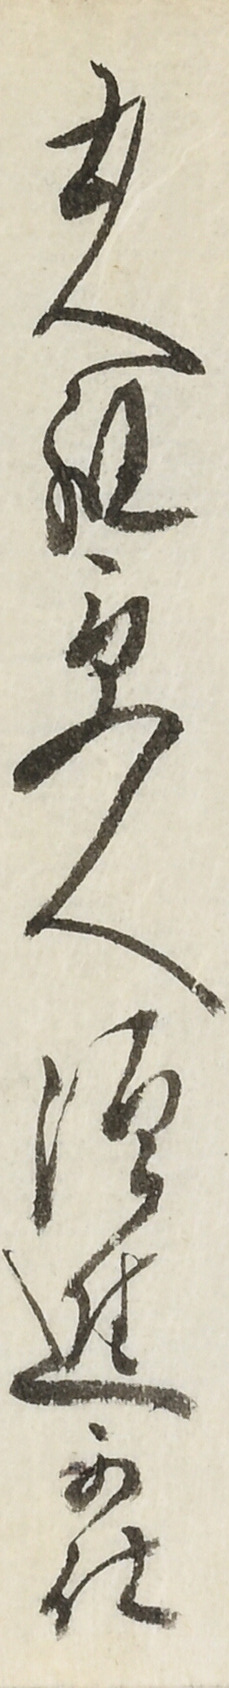五人組受人注進可仕
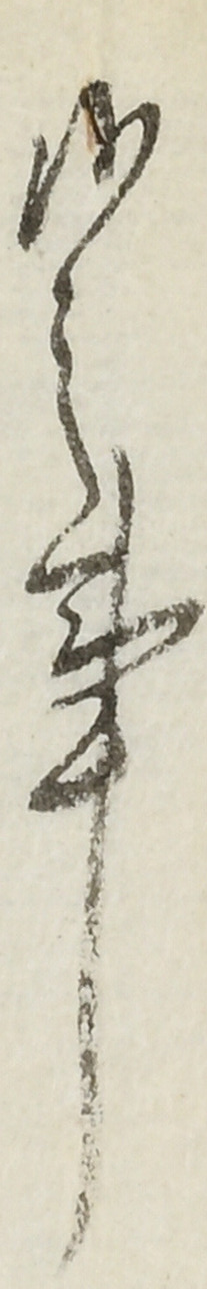候之事
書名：文久二壬戌年正月石切名前書上帳
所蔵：伊那市立高遠町図書館・合同会社AMANE
